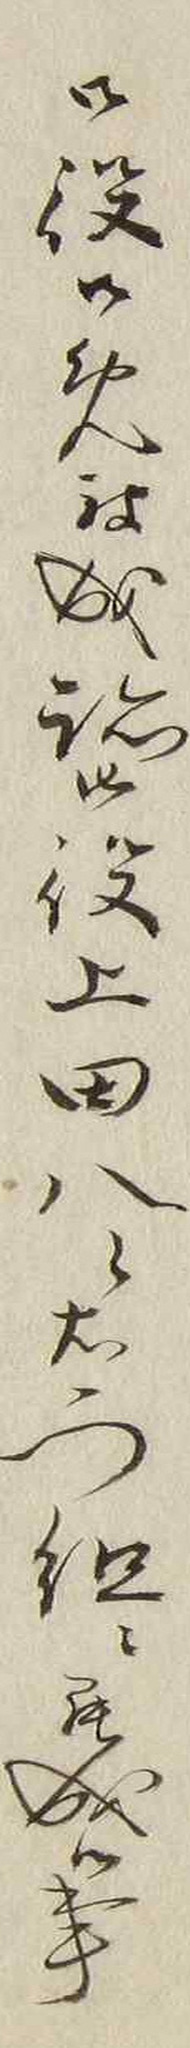御役御免被成跡御役上田八郎右衛門組に罷成候事
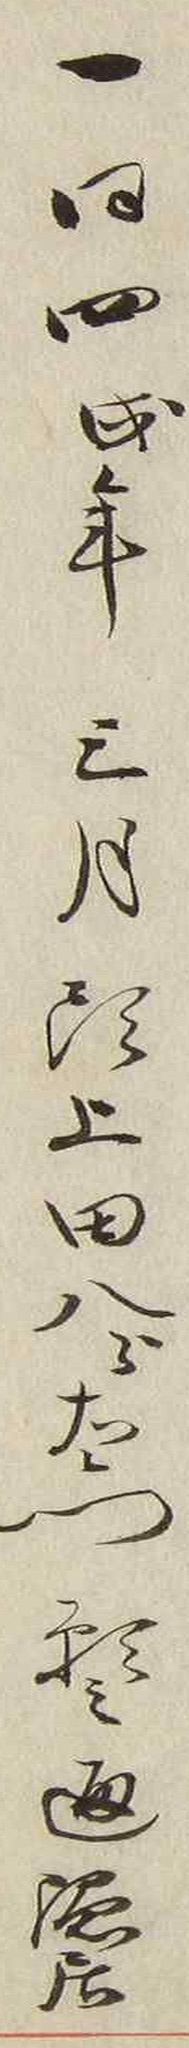一同四戌年三月頭上田八郎右衛門願之通隠居

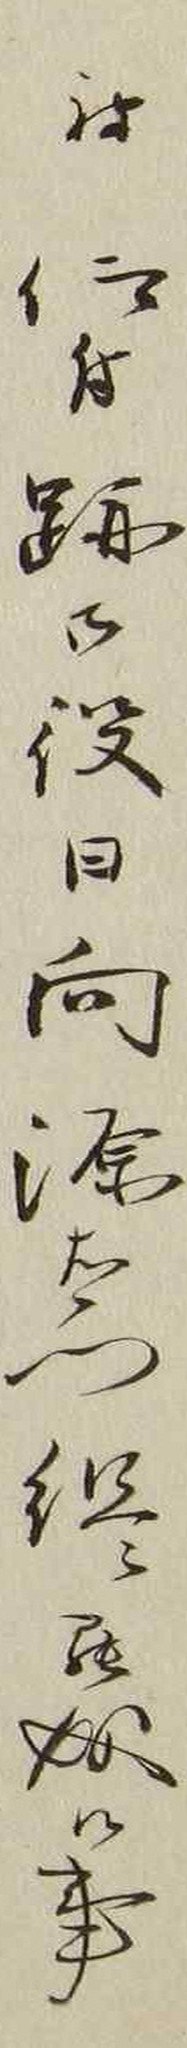被仰付跡御役日向源右衛門組に罷成候事
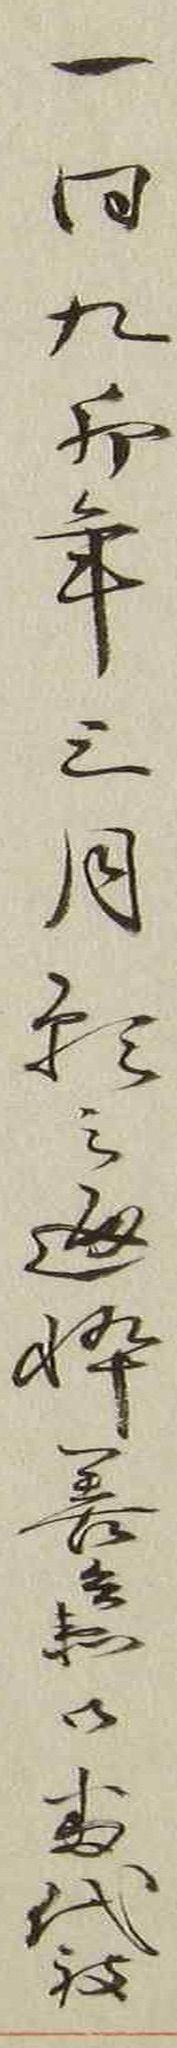一同九卯年三月願之通悴善兵衛御番代被
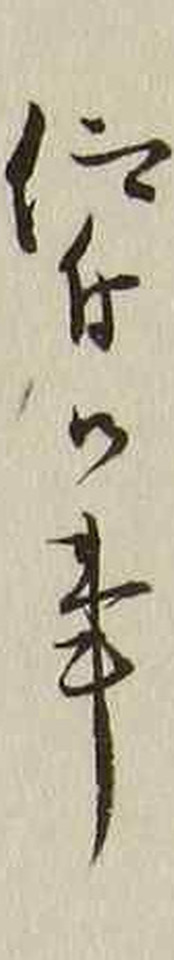仰付候事
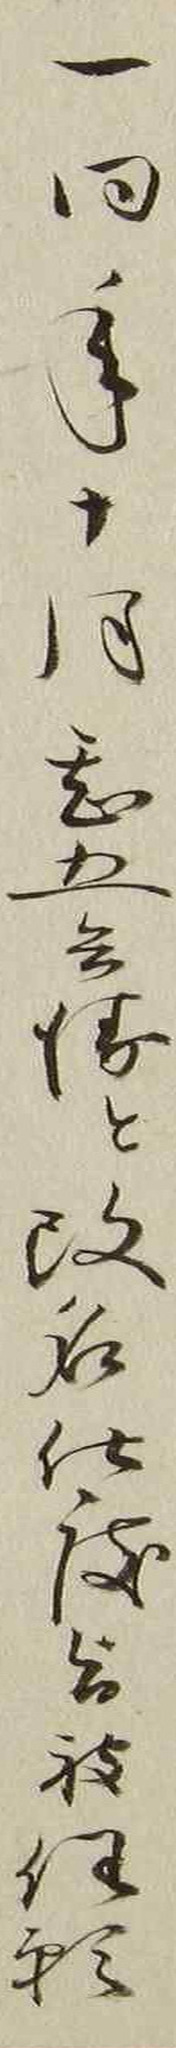一同年十月甚五兵衛と改名仕度旨被任願
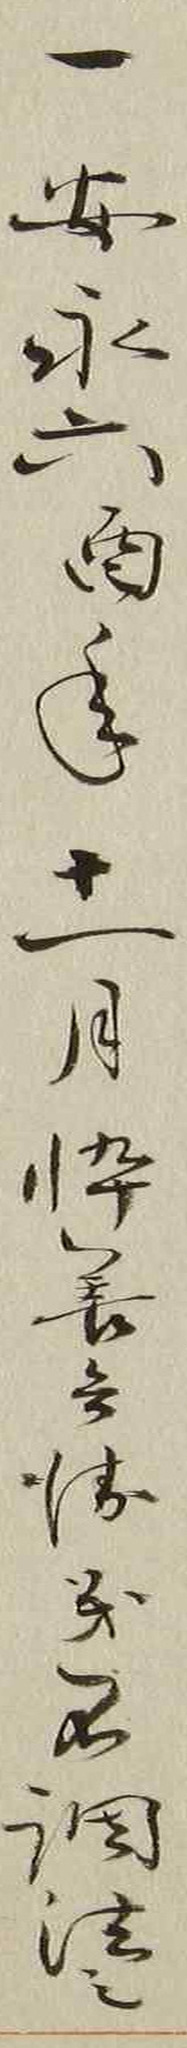一安永六酉年十一月悴善兵衛義不調法之
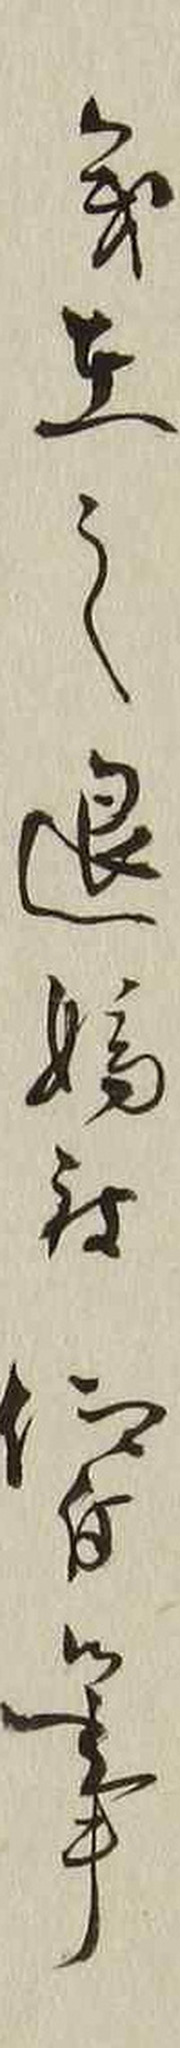義在之退嫡被仰付候事
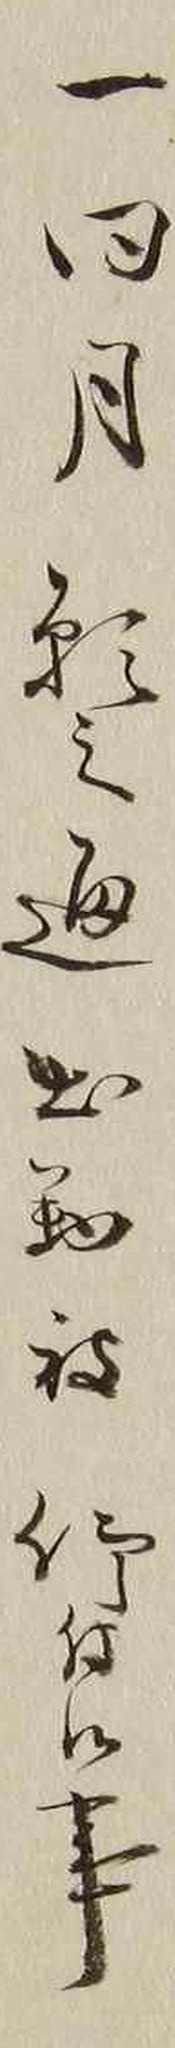一同月願之通出勤被仰付候事
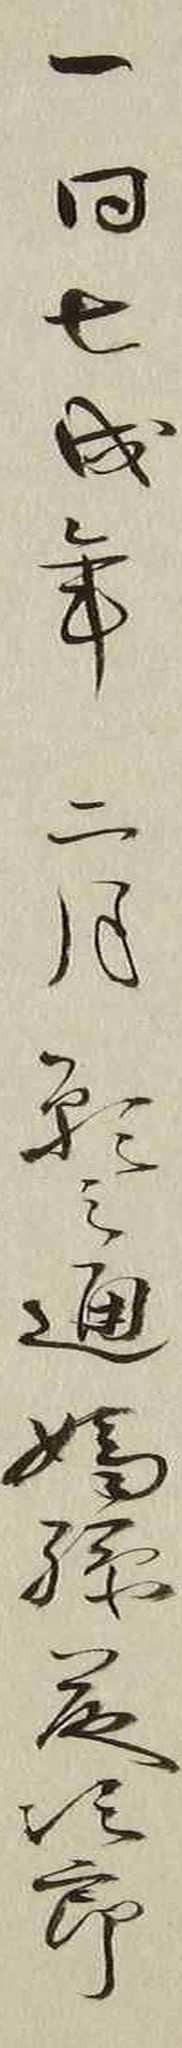一同七戌年二月願之通嫡孫藤次郎
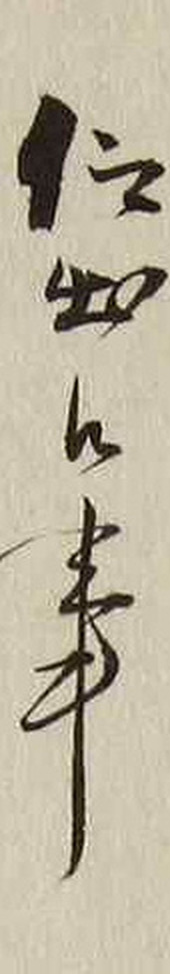仰出候事
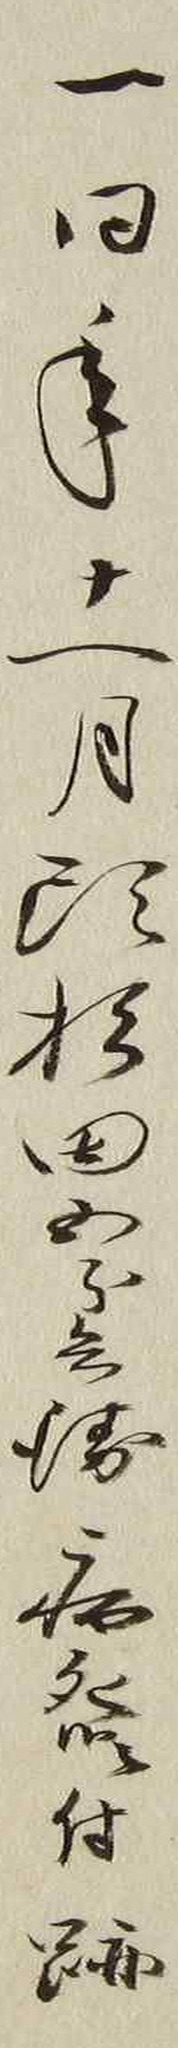一同年十一月頭杉田五郎兵衛病死候に付跡
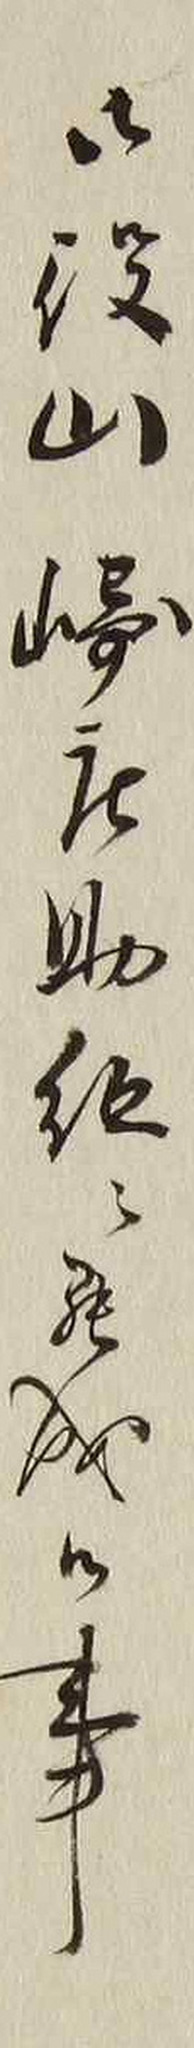御役山崎庄助組に罷成候事
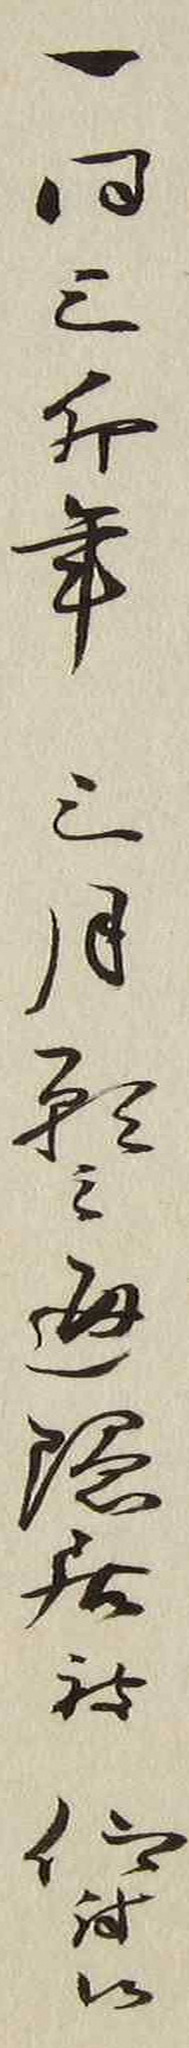一同三卯年三月願之通隠居被仰付候
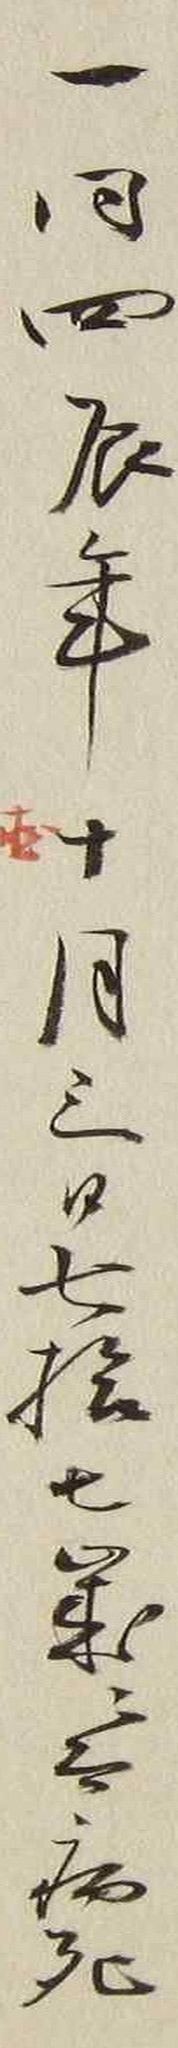一同四辰年十月三日七拾七歳に而病死
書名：諸士系譜　巻之157　ね之部1
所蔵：会津若松市立会津図書館
